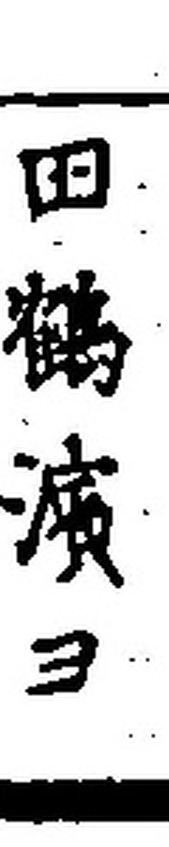田鶴浜ヨ
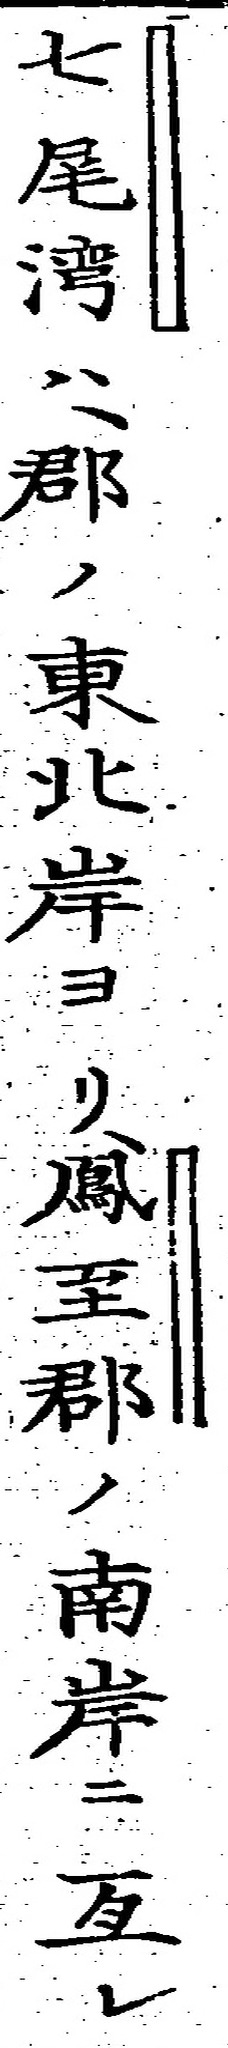七尾湾ハ、郡ノ東北岸ヨリ、鳳至郡ノ南岸ニ亙レ
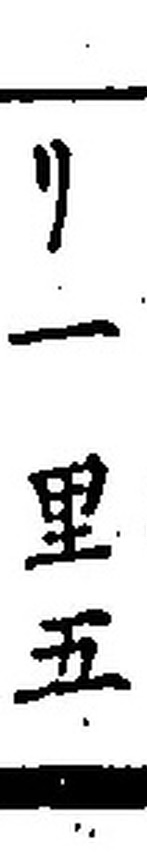リ一里五
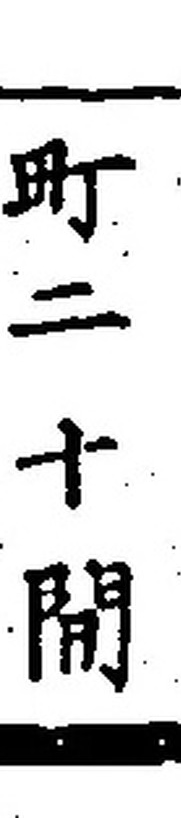町二十間
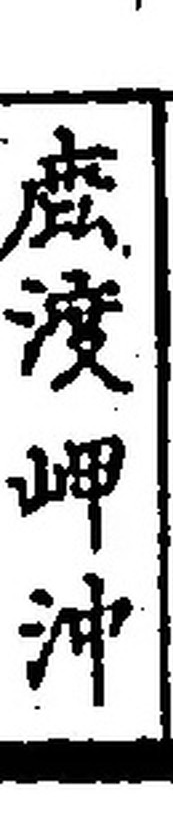鹿渡岬沖
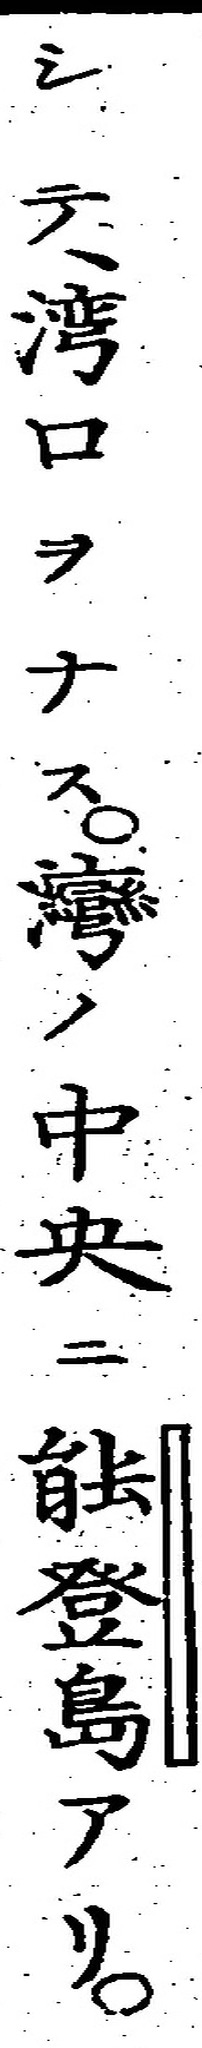シテ、湾口ヲナス。湾ノ中央ニ能登島アリ。
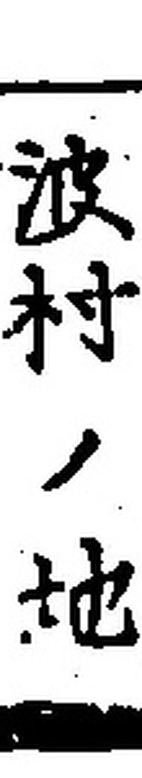波村ノ地
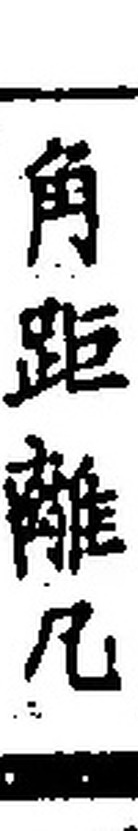角距離凡
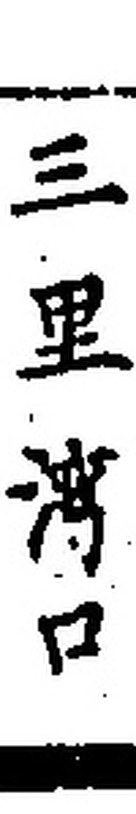三里湾口
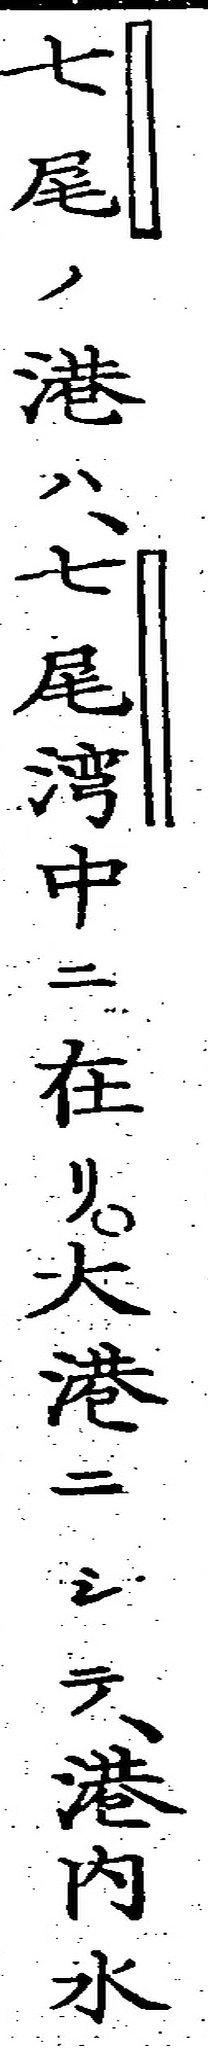七尾ノ港ハ、七尾湾中ニ在リ。大港ニシテ、港内水
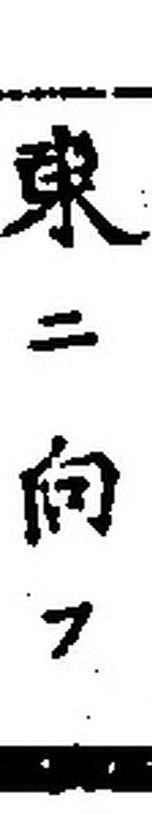東ニ向フ
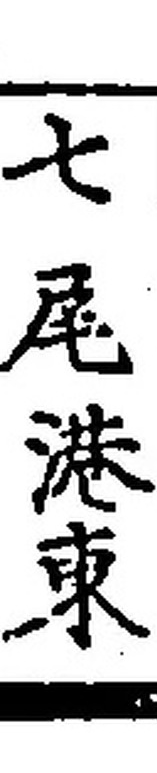七尾港東
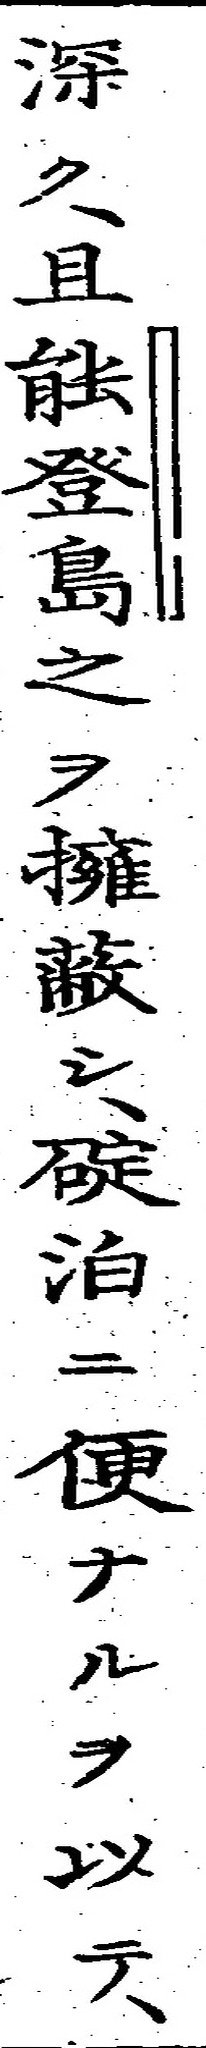深ク、且能登島之ヲ擁蔽シ、碇泊ニ便ナルヲ以テ、
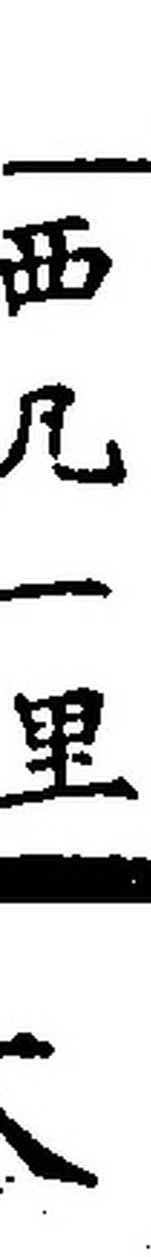西凡一里
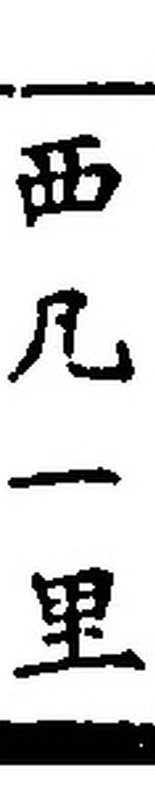西凡一里
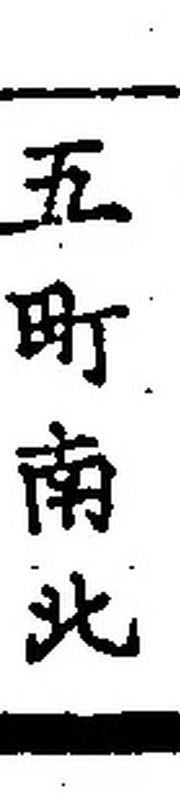五町南北
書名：能登地誌略
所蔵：国立国会図書館 National Diet Library, JAPAN
